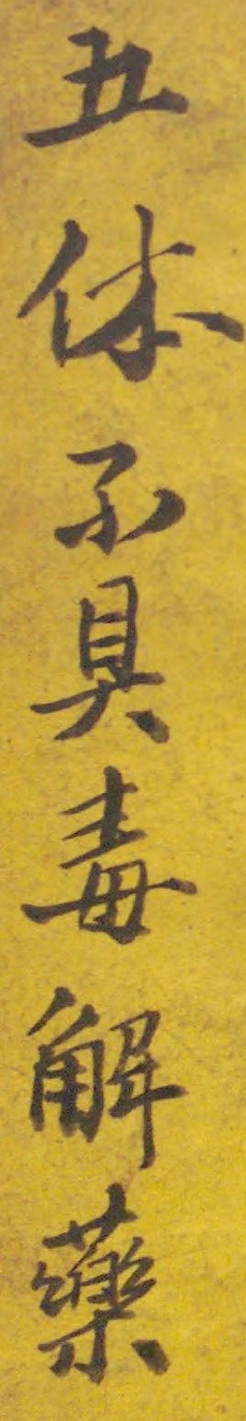五体不具毒解薬

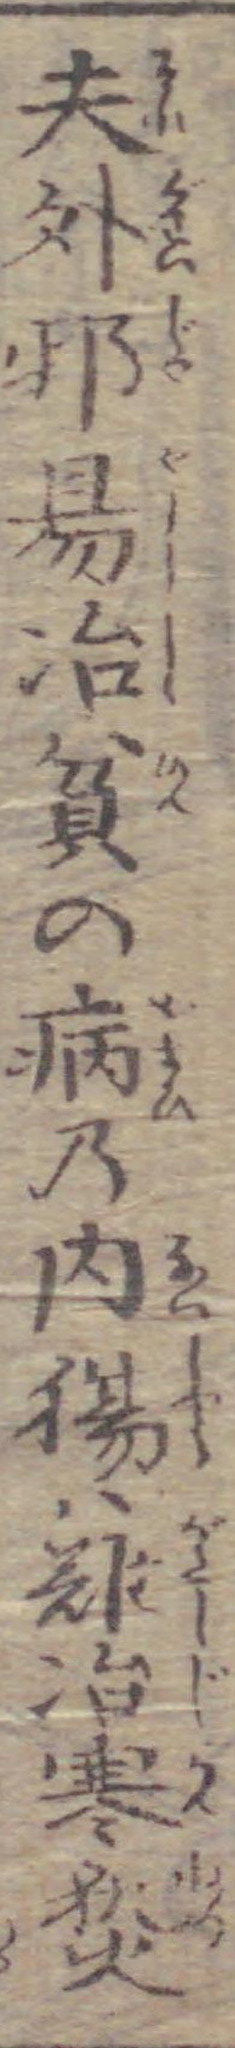夫外邪易治貧の病の内傷ハ難冶寒熱
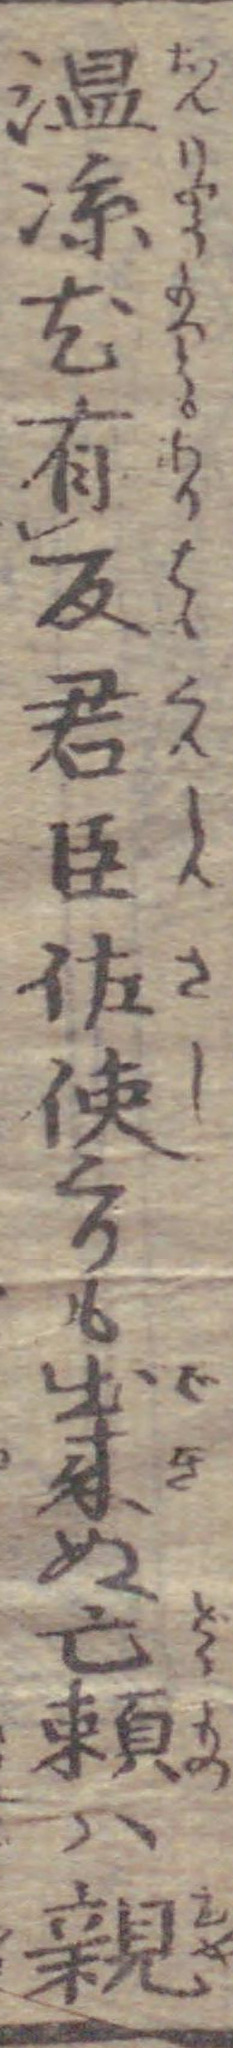温凉尤有反君臣佐使くりも出来ぬ亡頼ハ親
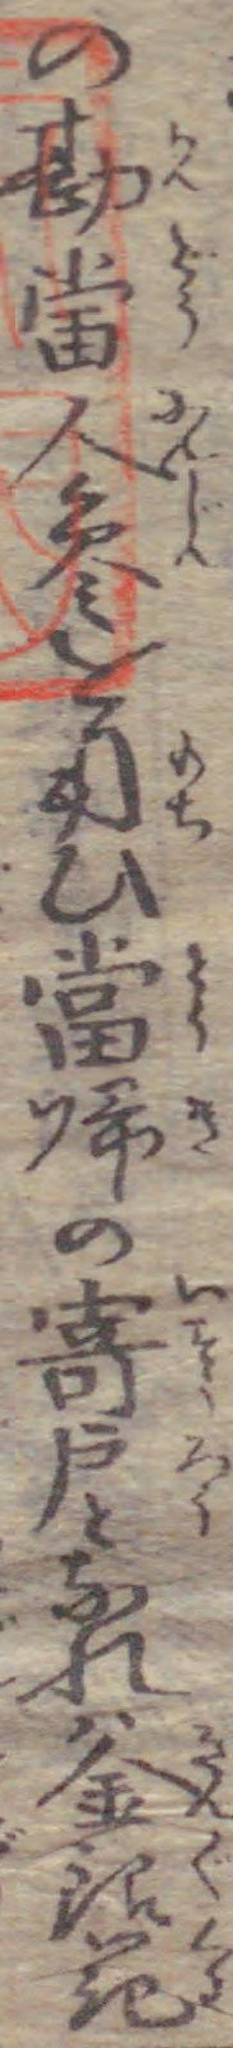の勘当人参を用ひ当帰の寄戸となれㇵ金銀花
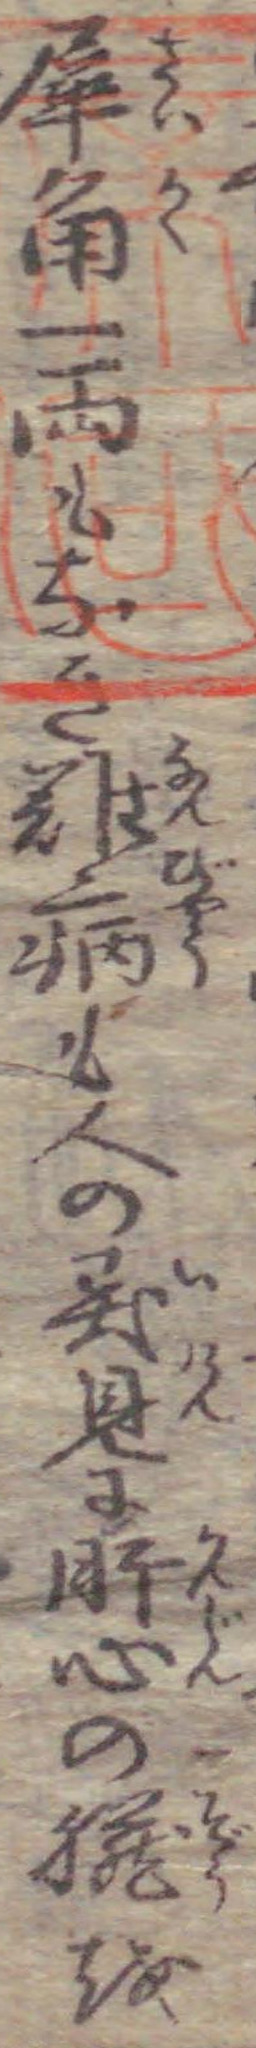犀角一両もなき難病も人の異見に肝心の蔵を
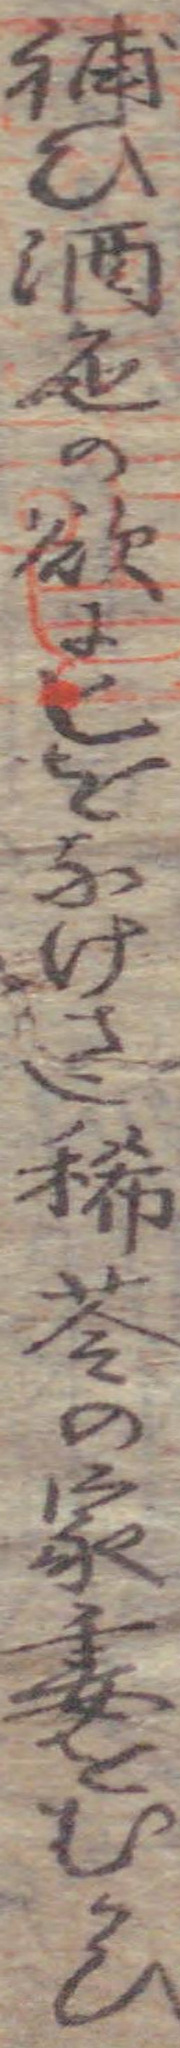補ひ酒色の欲に匕をなげさし稀苓の家妻をむかひ
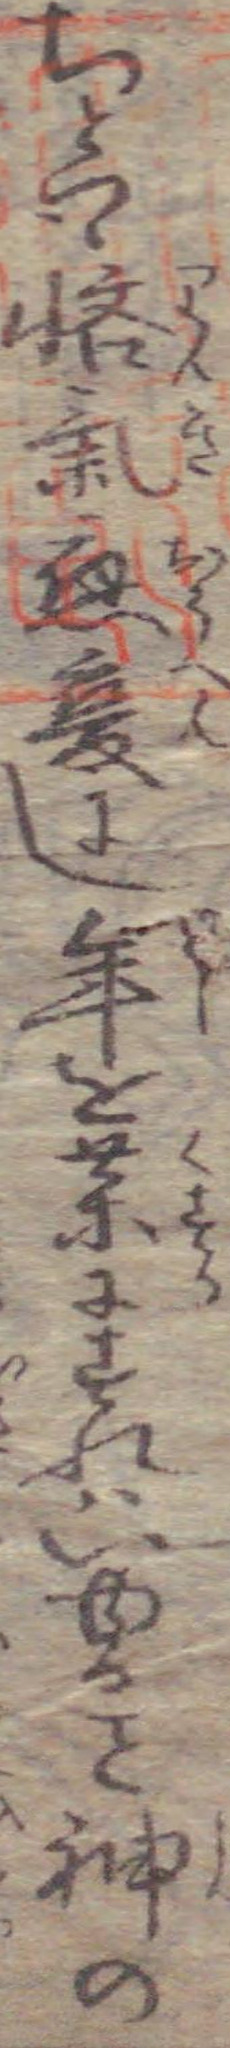ちといゝ悋気応変にし年を薬にすれㇵいゆるを神の
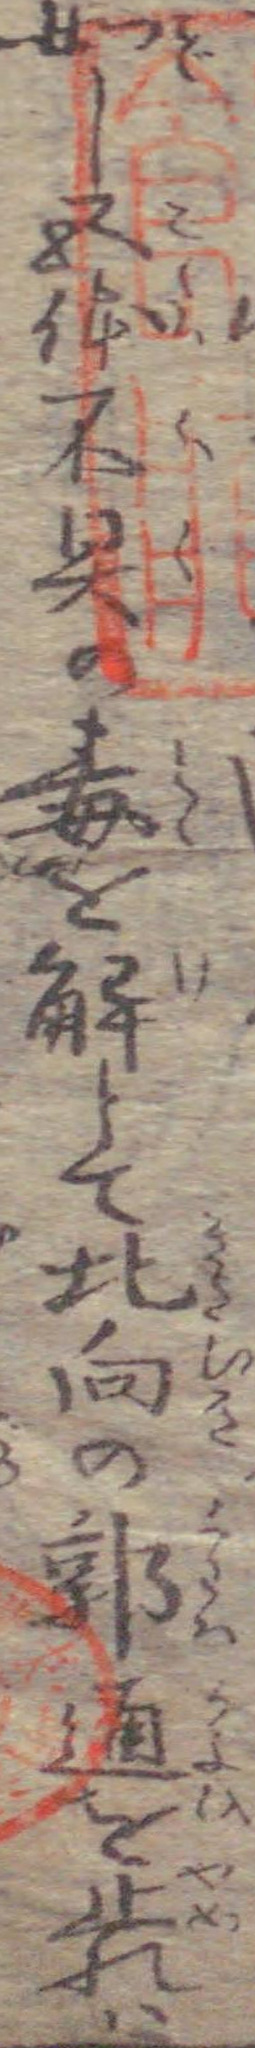如し五体不具の毒を解して北向の郭通を止れㇵ
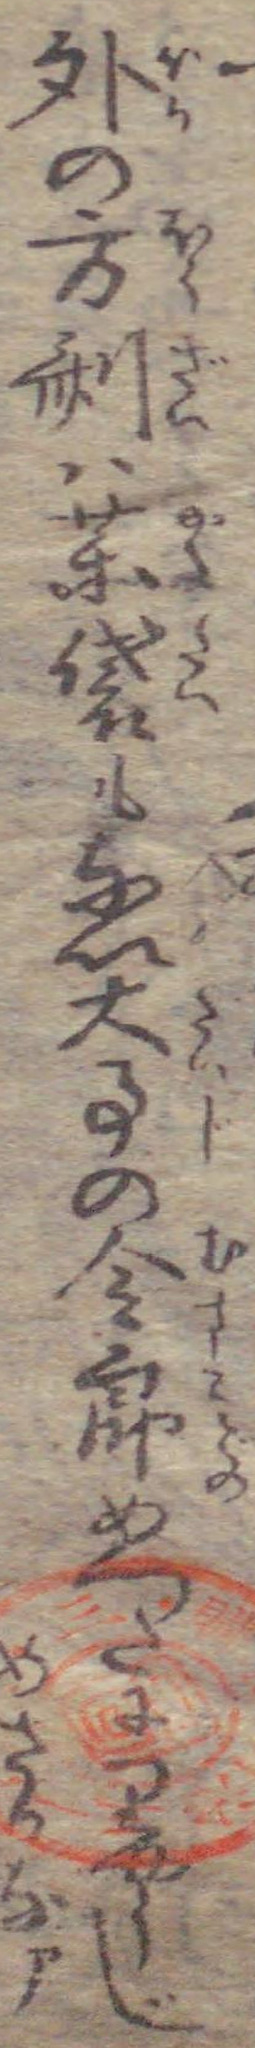外の方剤ㇵ薬袋もない大事の令郎めつたにりやうじ
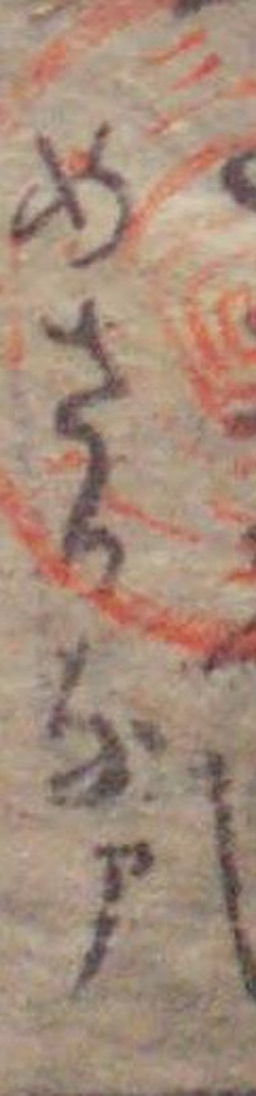めさるなァ

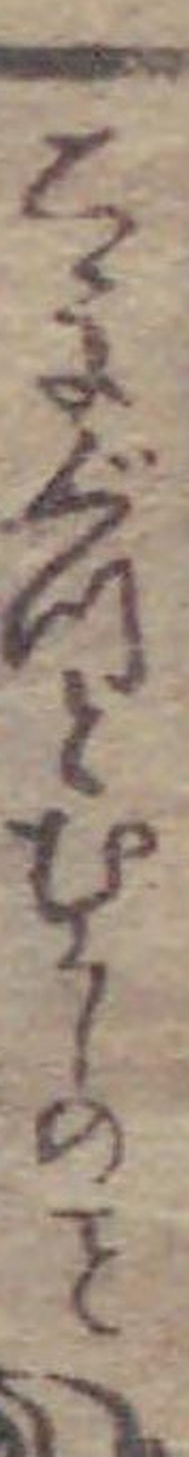こゝにぐつとむかしのこと
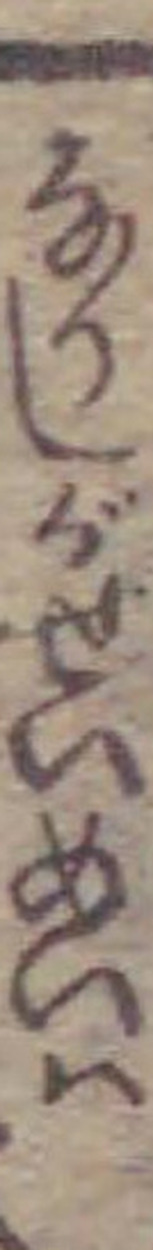なりしがせいめいは
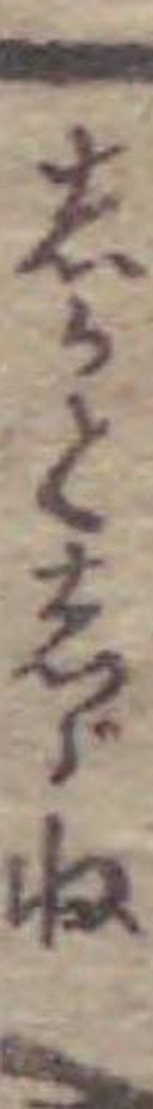しかとしらね
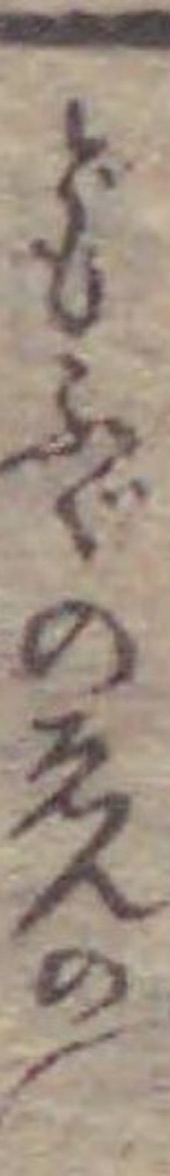どもふぐのゑんの
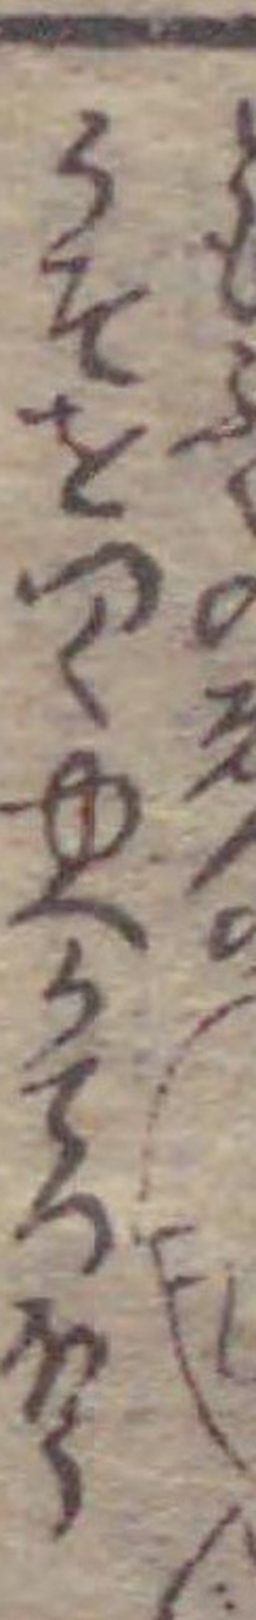うそをつくゆへかてつほう
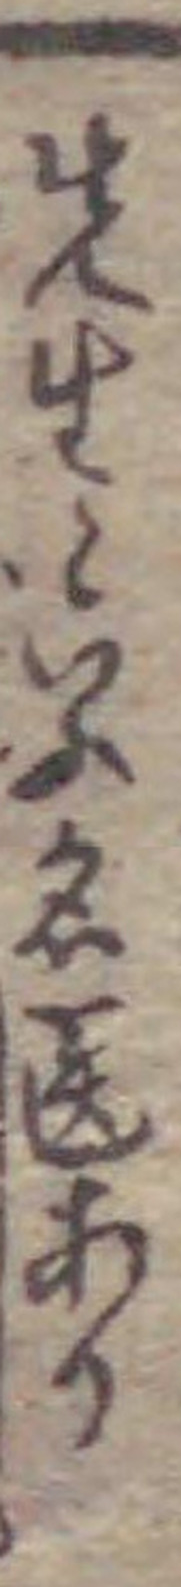先生といふ名医あり
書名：五躰不具毒解薬 : 3巻
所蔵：国立国会図書館 National Diet Library, JAPAN
